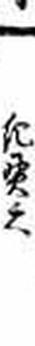紀貫之
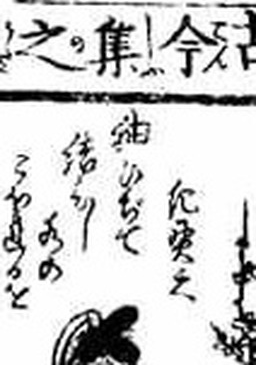袖ひちて
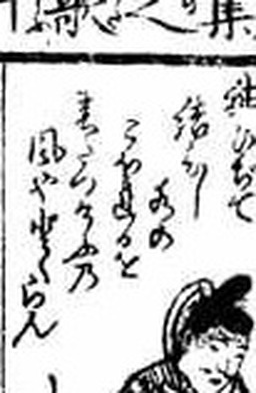こほれるを
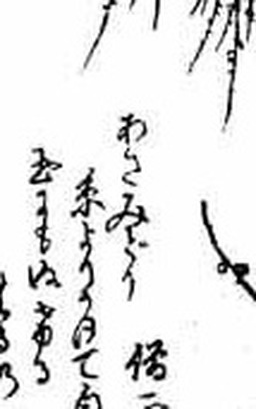あさみとり
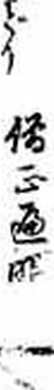僧正遍照
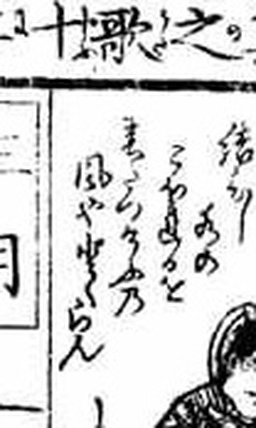春たつけふの
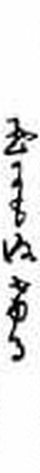玉にもぬける
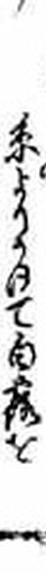糸よりかけて白露を
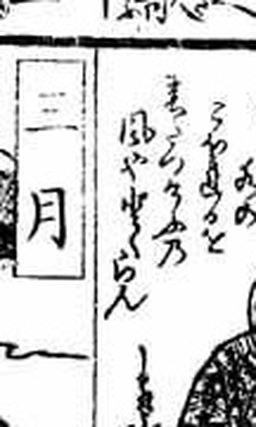風やふくらん
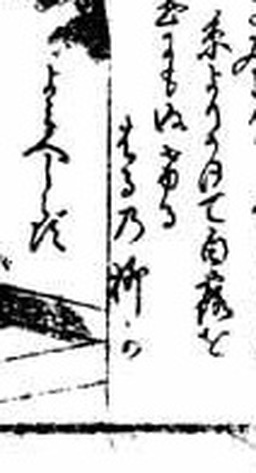はるの柳か
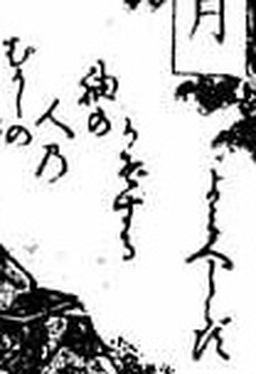かぞする
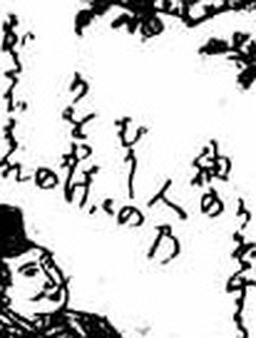むかしの
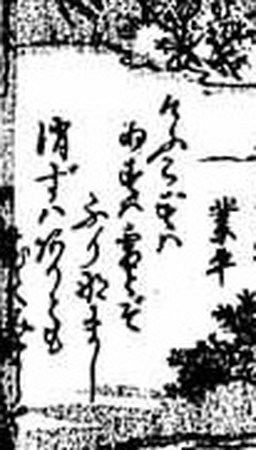あすはゆきとぞ
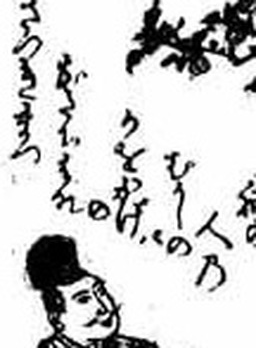かをかげ
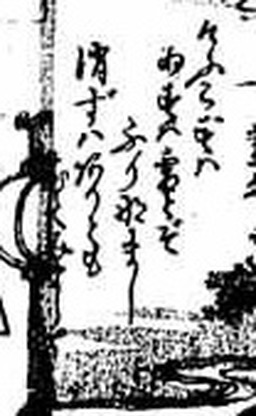ふりなまし
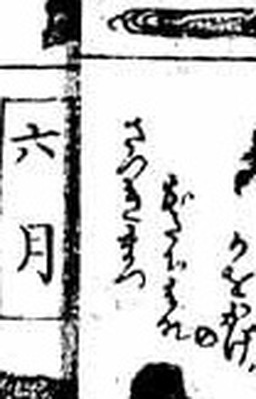さつきまつ
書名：小倉百人一首
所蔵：東京学芸大学教育コンテンツアーカイブ
